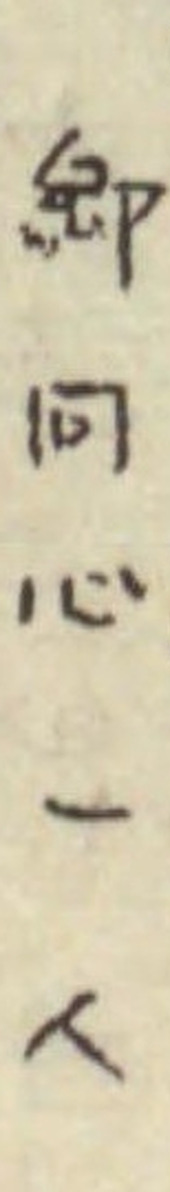御同心一人
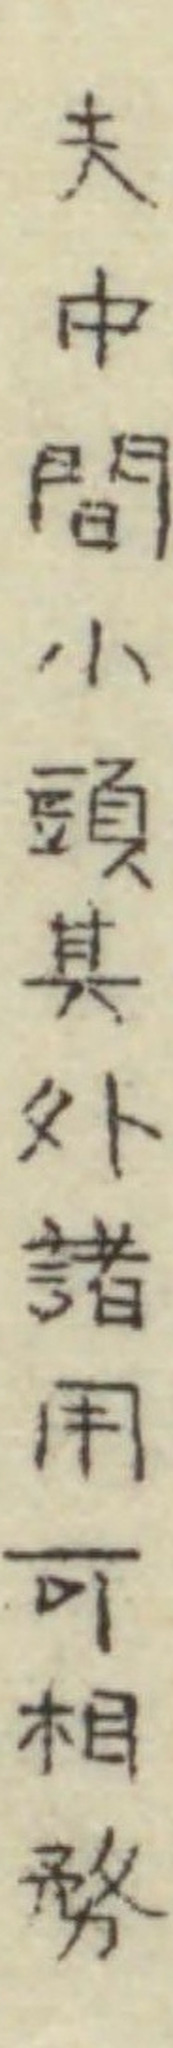夫中間小頭其外諸用可相務庄屋
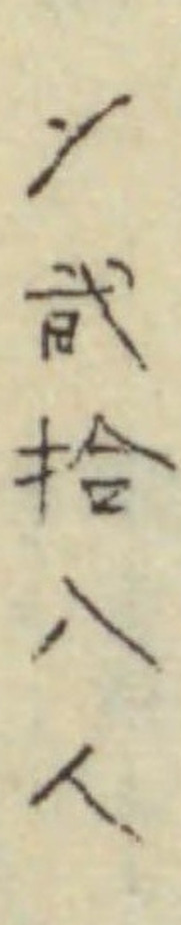〆弐拾八人

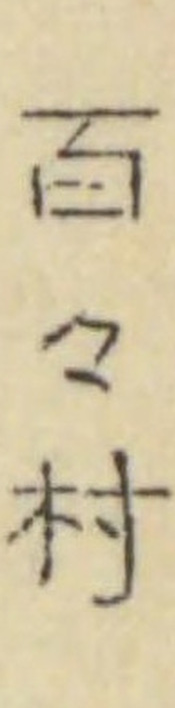百々村
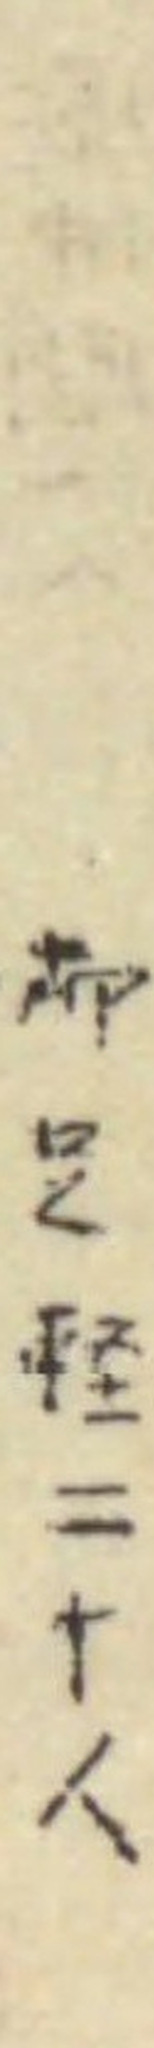御足軽二十人
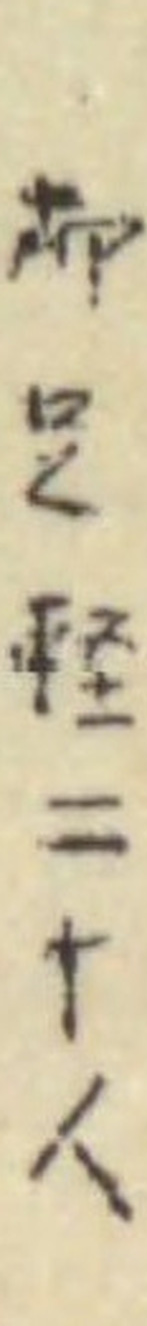御足軽二十人
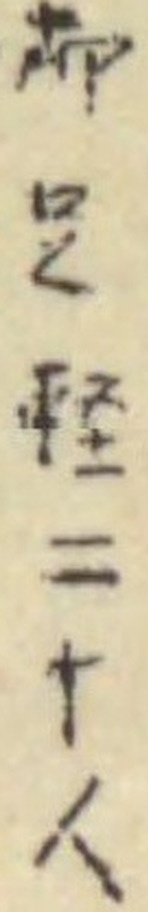御足軽二十人
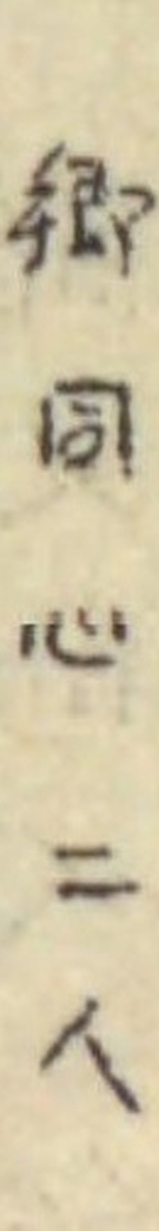郷同心二人
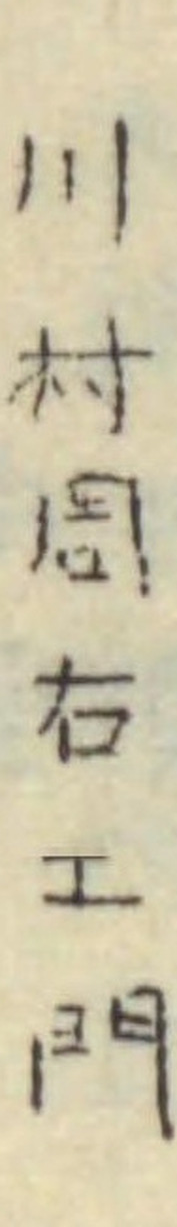川村周右エ門
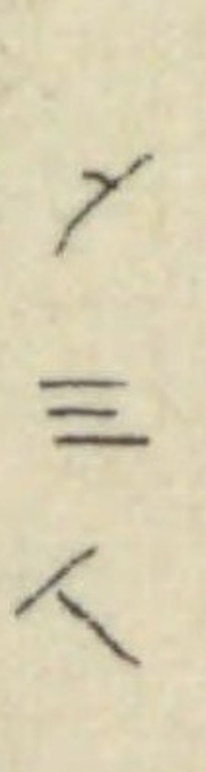〆三人
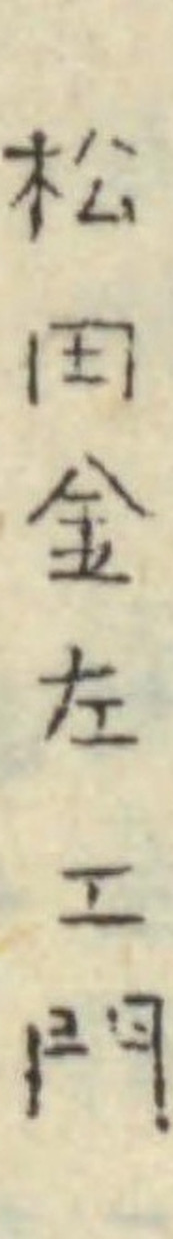松田金左エ門
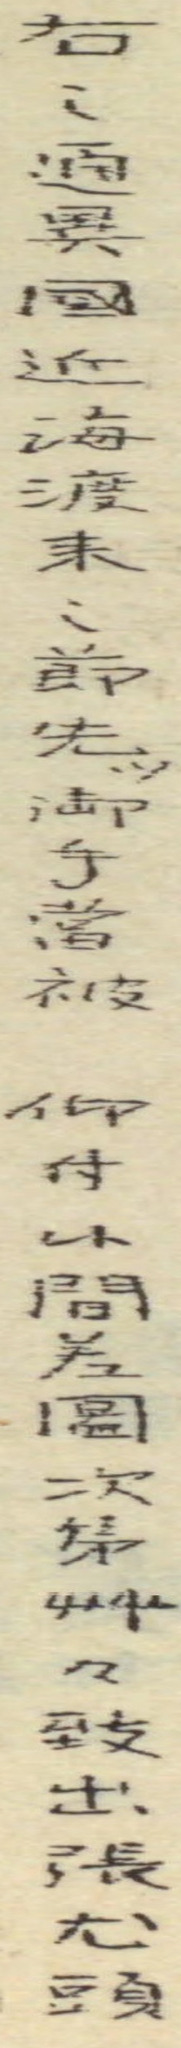右之通異国近海渡来之節先ッ御手当被仰付候間指図次第早々致出張尤頭
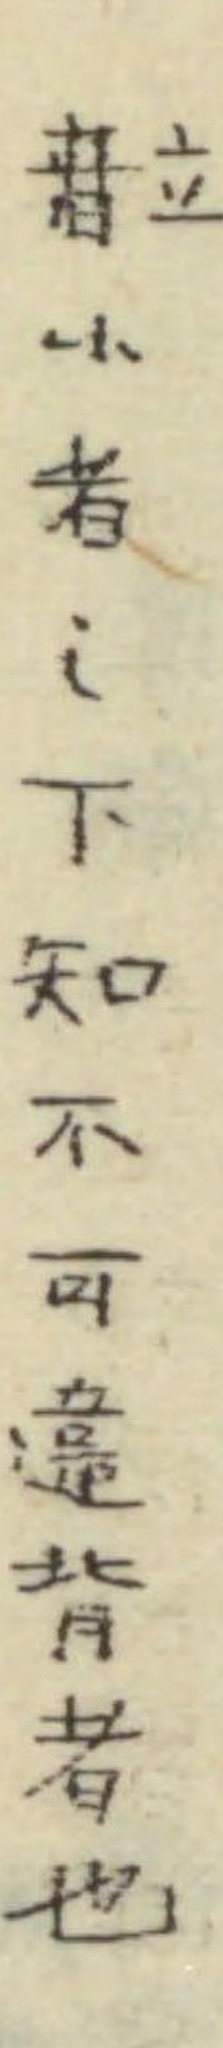立之小者之下知不可違背者也
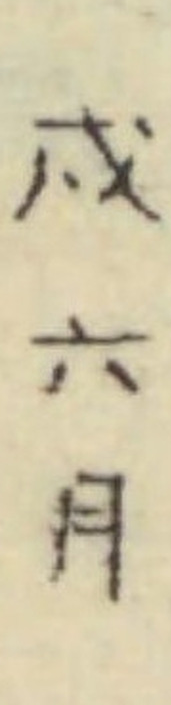戌六月
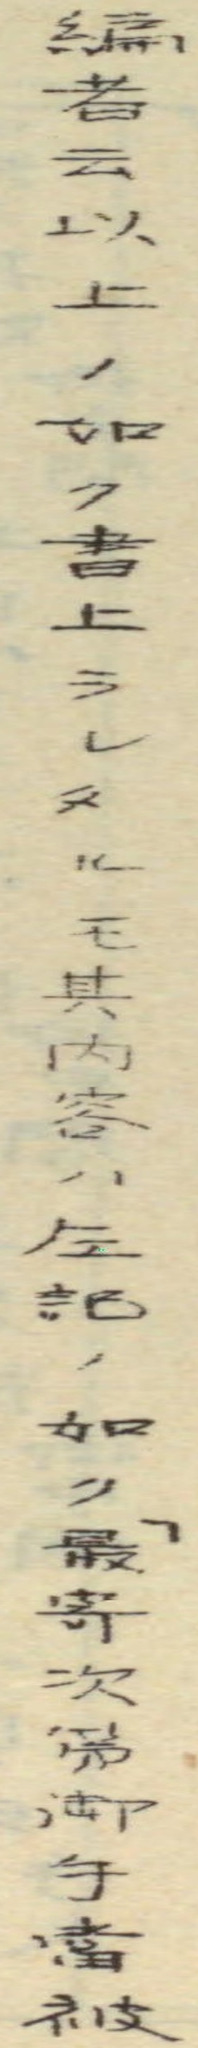編者云已上ノ如ク書上ラレタルモ其内容ハ左記ノ如ク「最寄次第御手当被
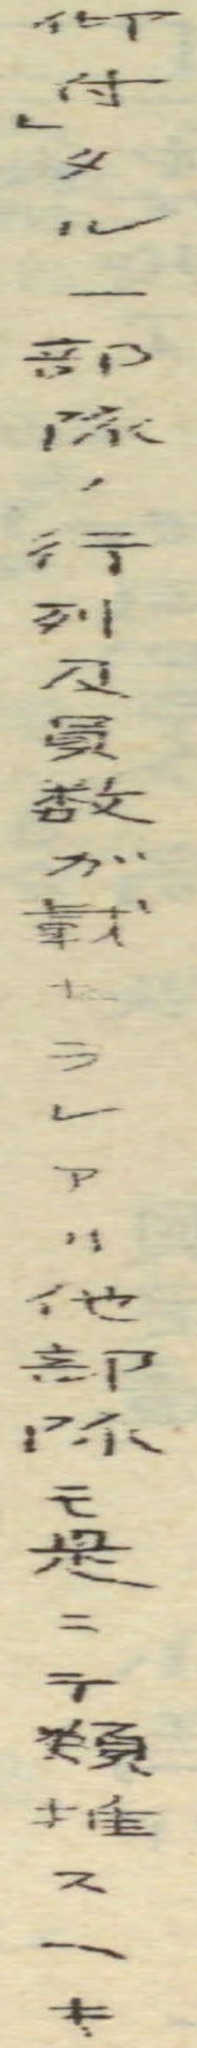仰付」タル一部隊ノ行列及員数が載セラレアリ他部隊モ是ニテ類推スヘキ
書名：三河吉田藩動員史料
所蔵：国立国会図書館 National Diet Library, JAPAN
